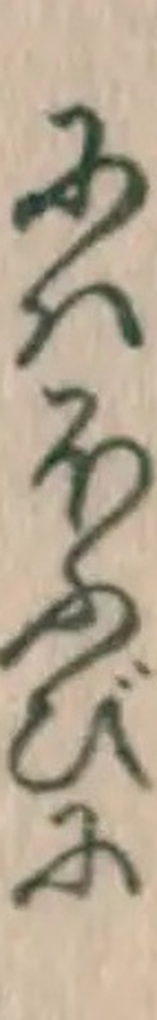にはほふびに
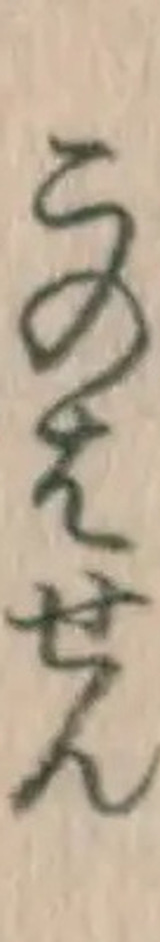このはせん
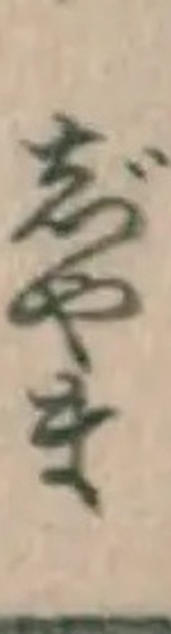じやま
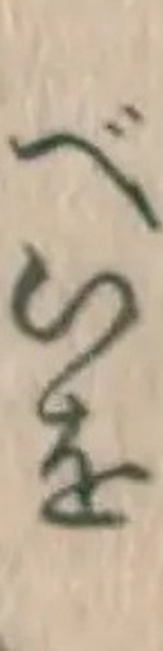べいを
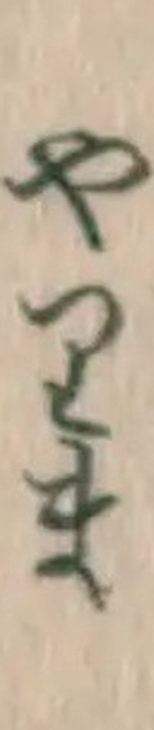やりま
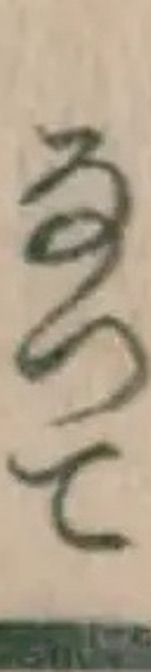なつて
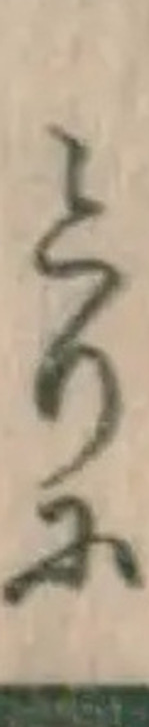とりに
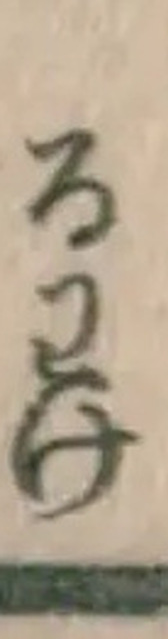るわけ

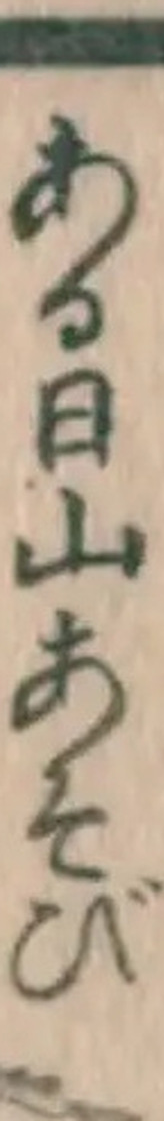ある日山あそび
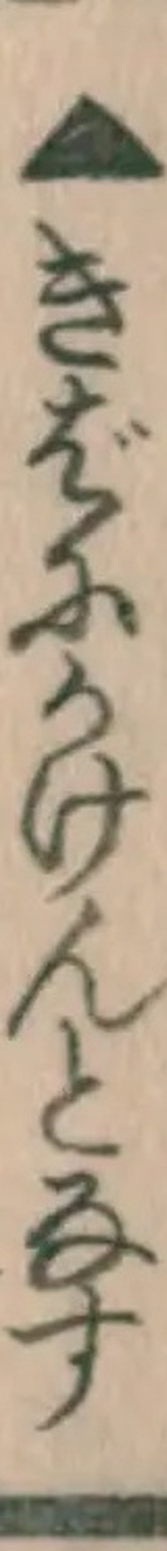▲きばにかけんとなす
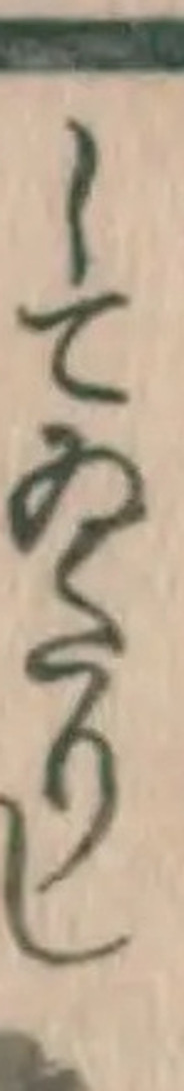してゐたりし
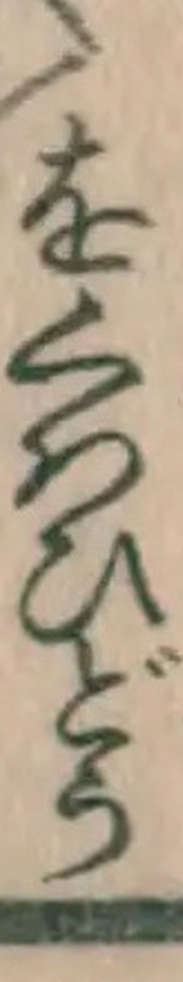をくはひどう
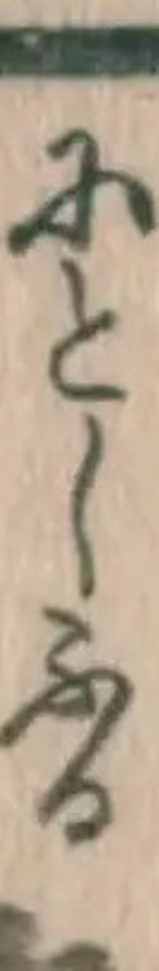にとしふる
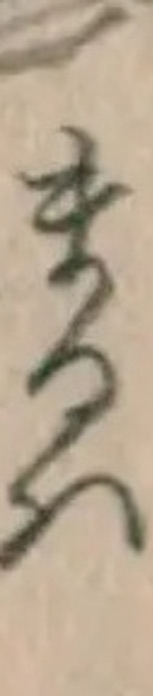まるは
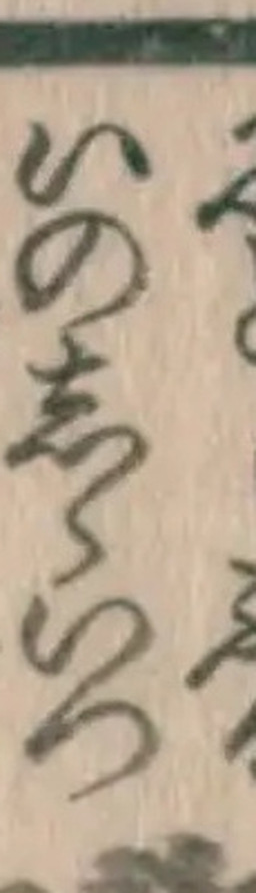いのしゝいつ
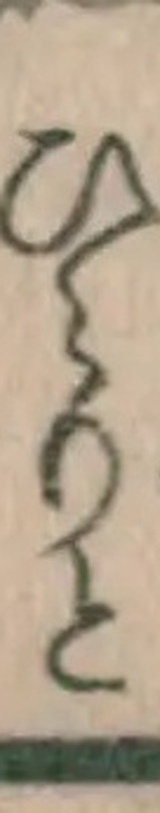ひらりと
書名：金太郎
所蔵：国立国会図書館 National Diet Library, JAPAN
